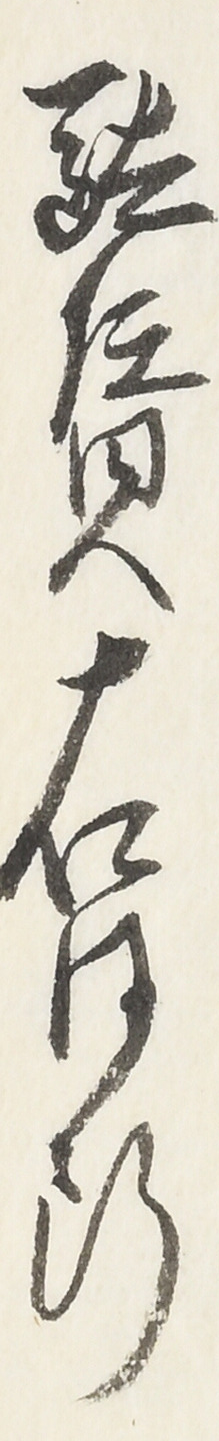駄賃右同断

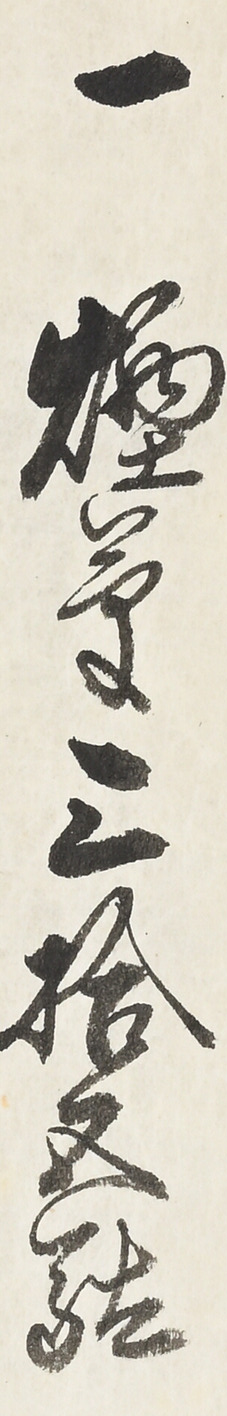一煙草三拾五駄但
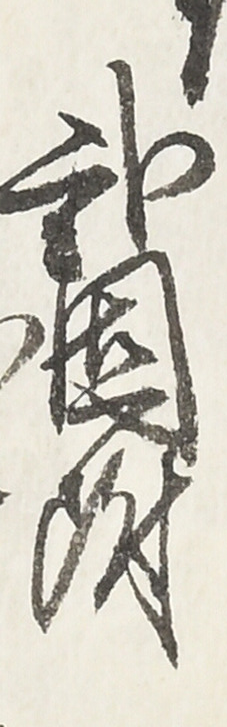弐固附
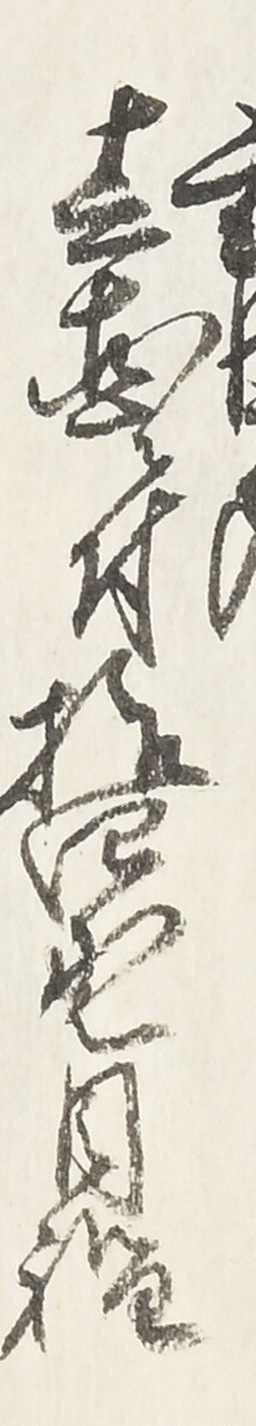壱固ニ付拾四貫目程
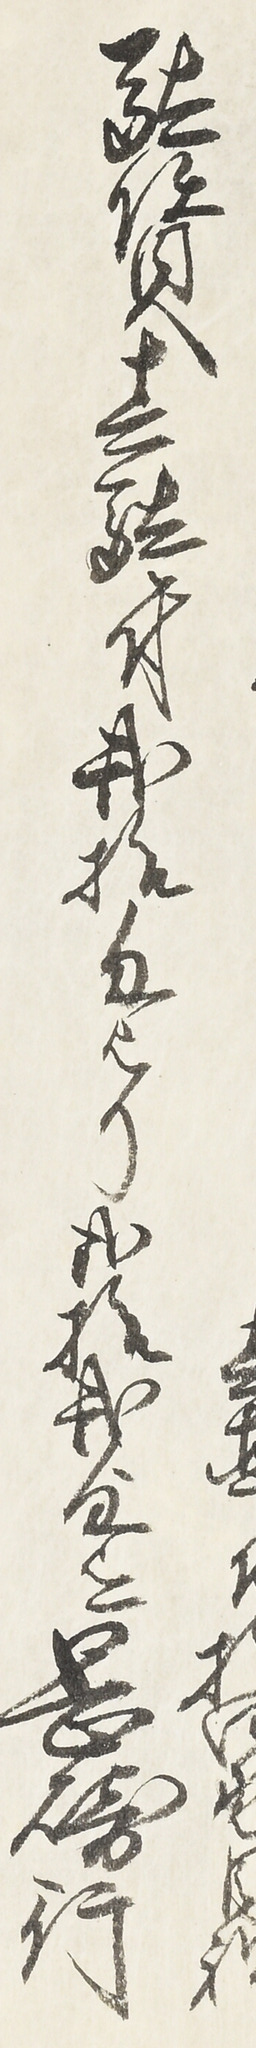駄賃壱駄ニ付弐拾匁より弐拾弐匁迄
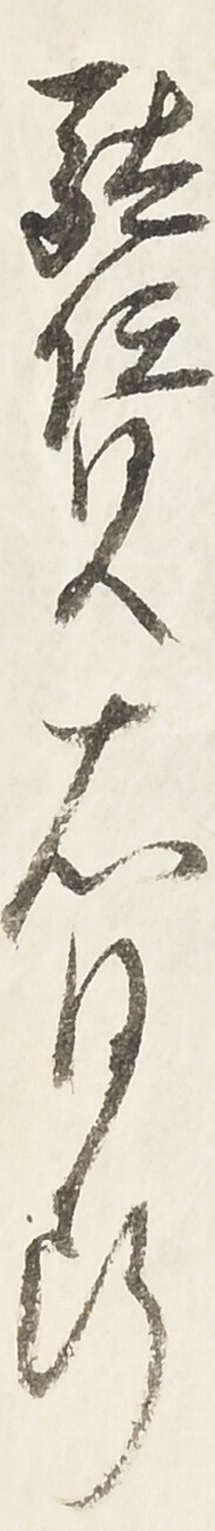駄賃右同断
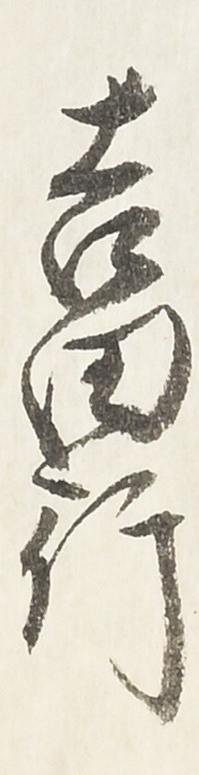吉田行
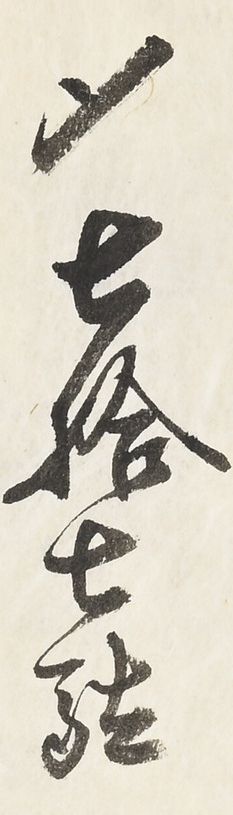〆七拾七駄
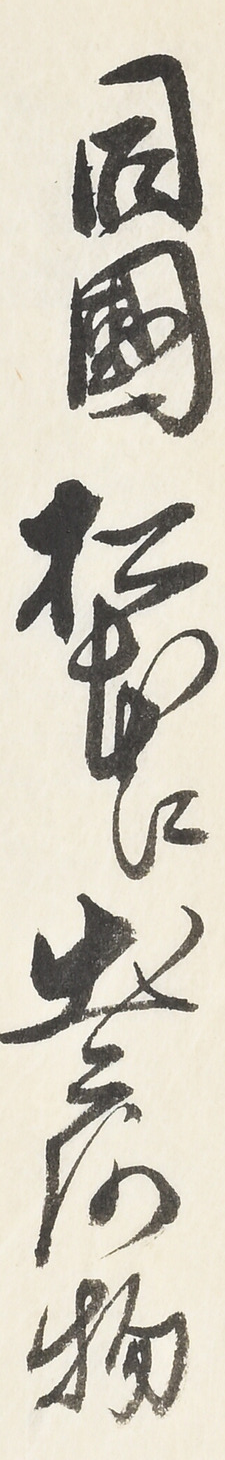同國松本江出荷物
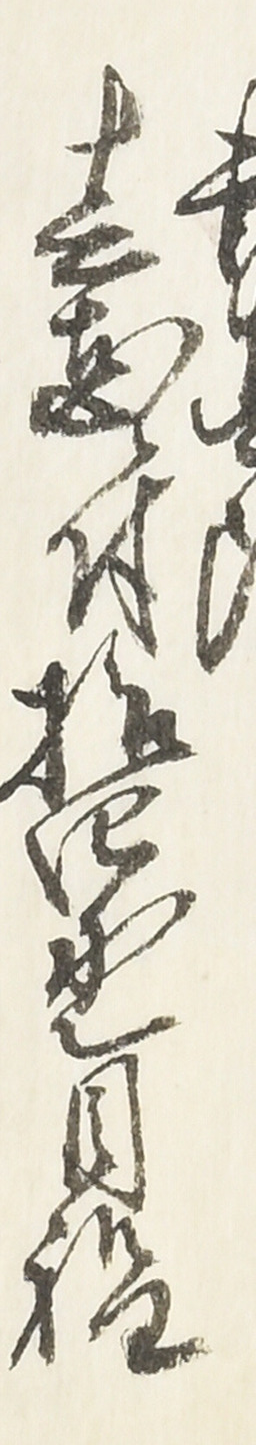壱固ニ付拾四貫目程
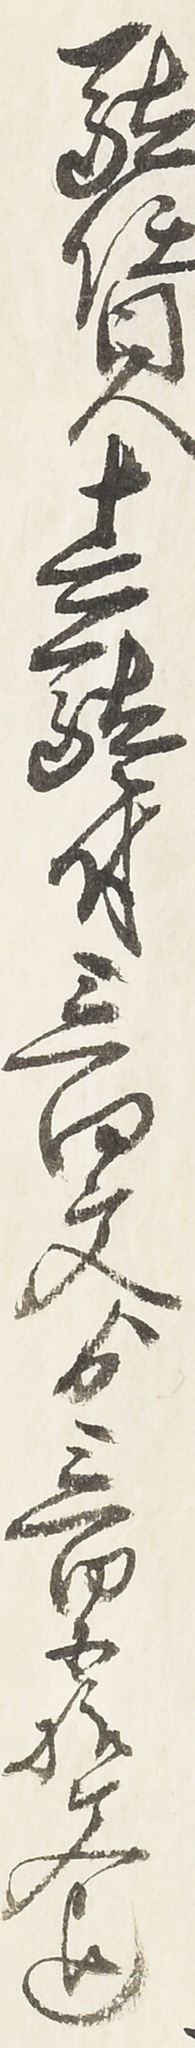駄賃壱駄ニ付三百文より三百五拾文迄
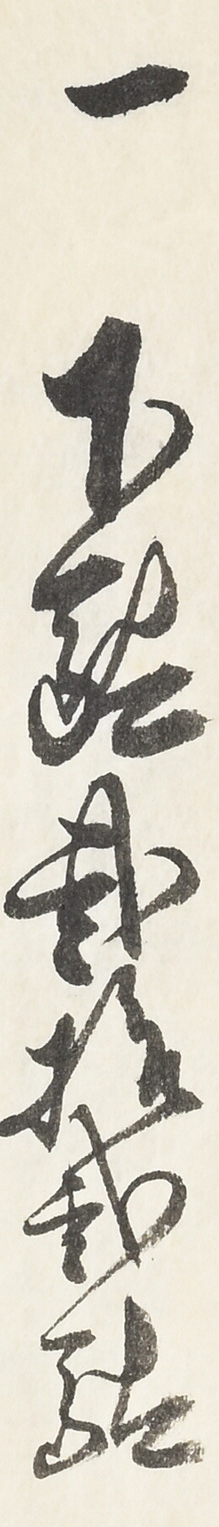一下駄弐拾弐駄但
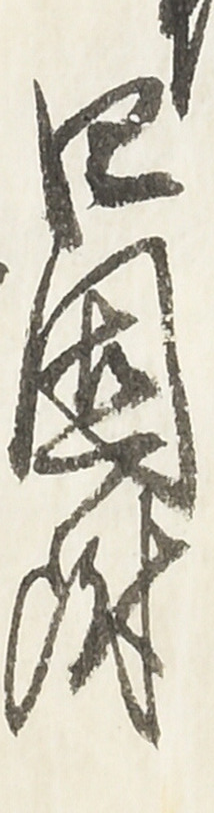四固附
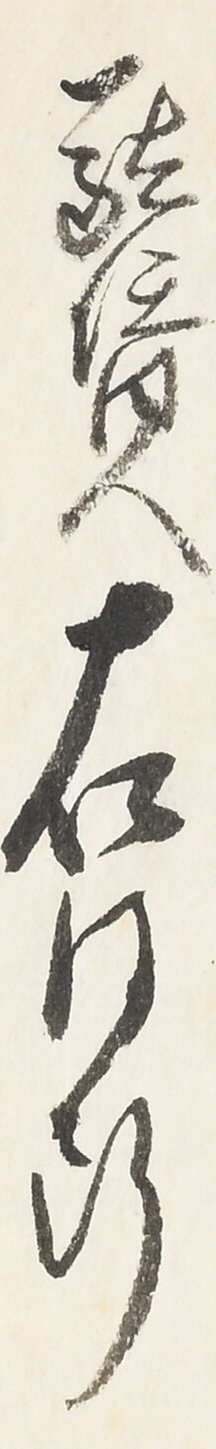駄賃右同断
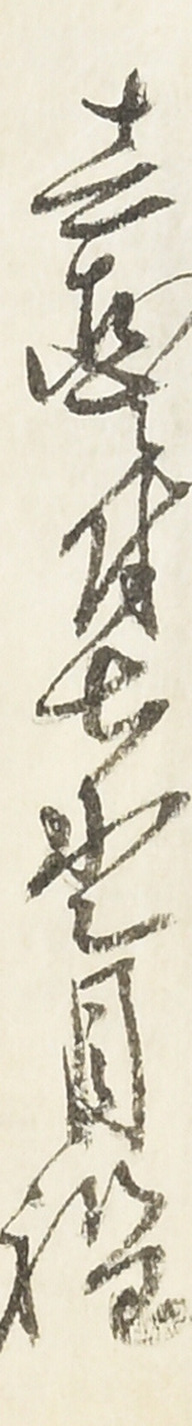壱固ニ付七貫目程

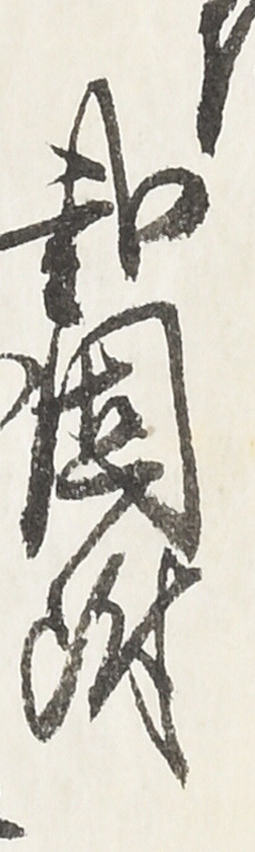弐固附
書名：中馬ニテ附通候出入荷物目録帳
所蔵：伊那市立高遠町図書館・合同会社AMANE
